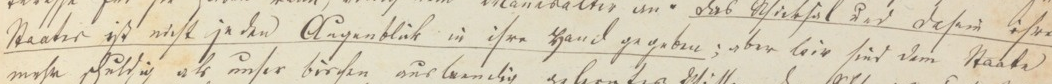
Staates ist nicht jeden Augenblick in ihre Hand gegeben; aber wir sind dem Staate
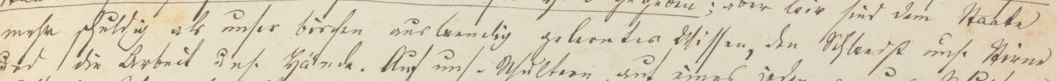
mehr schuldig als unser bischen auswendig gelerntes Wissen, den Schweiß uns. Stirne
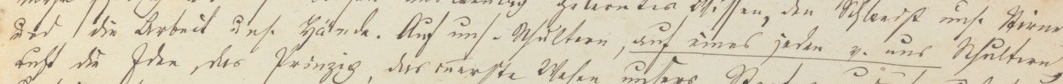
und die Arbeit uns. Hände. Auf uns. Schultern, auf eines jeden v. uns Schultern,
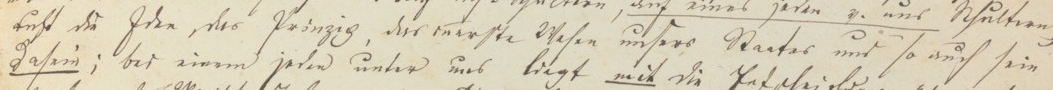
ruht die Idee, das Prinzip, das innerste Wesen unsers Staates und so auch sein
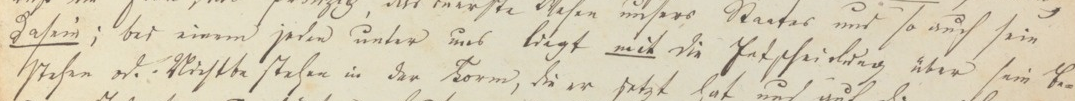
Dasein; bei einem jeden unter uns liegt mit die Entscheidung über sein Be-
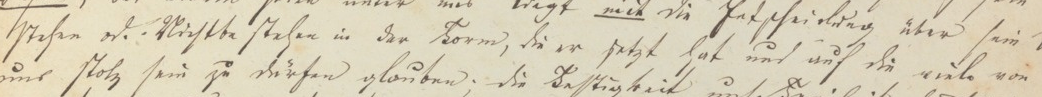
stehen od. Nichtbestehen in der Form, die er jetzt hat und auf die viele von
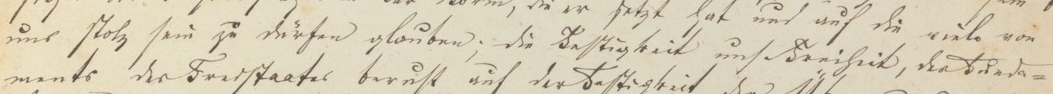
uns stolz sein zu dürfen glauben; die Festigkeit uns. Freiheit, des Funda-
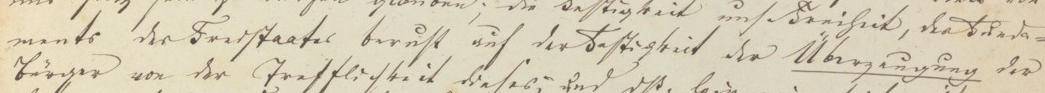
ments des Freistaates beruht auf der Festigkeit der Überzeugung der
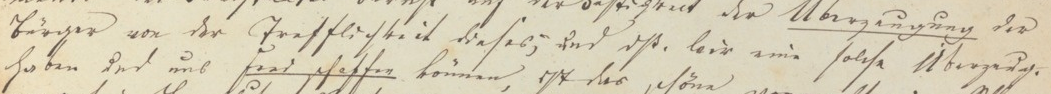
Bürger von der Trefflichkeit dieses; und dß. wir eine solche Überzeug.
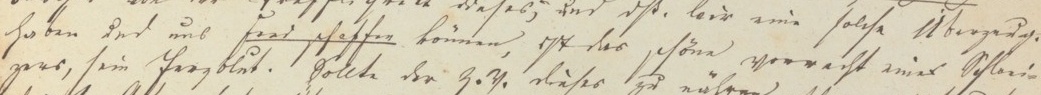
haben und uns frei schaffen können, ist das schöne vorrecht eines Schwei-
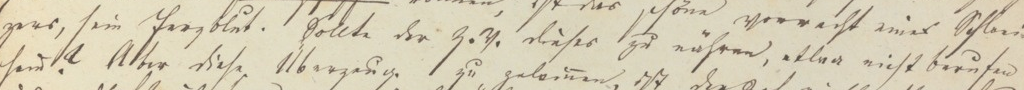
zers, sein Herzblut. Sollte der Z.V. dieses zu nähren, etwa nicht berufen
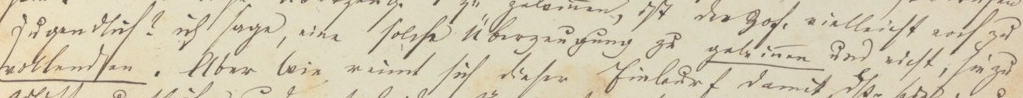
jugendlich? ich sage, eine solche Überzeugung zu gewinnen und nicht, sie zu
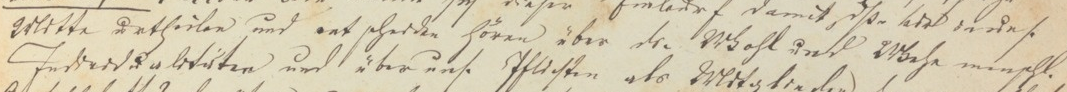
Mitte urtheilen und entscheiden hören über das Wohl und Wehe menschl.
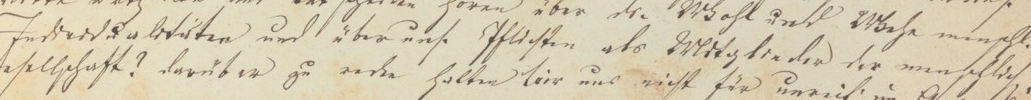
Individualitäten und über uns. Pflichten als Mitglieder der menschl.
